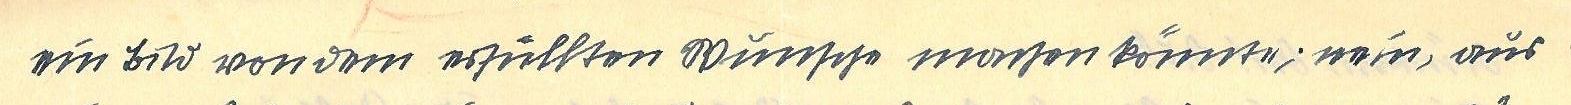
ein Bild von dem erfüllten Wunsche machen könnte; nein, aus
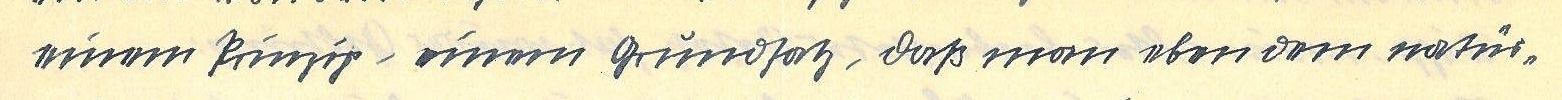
einem Prinzip, einem Grundsatz, daß man eben dem natür¬
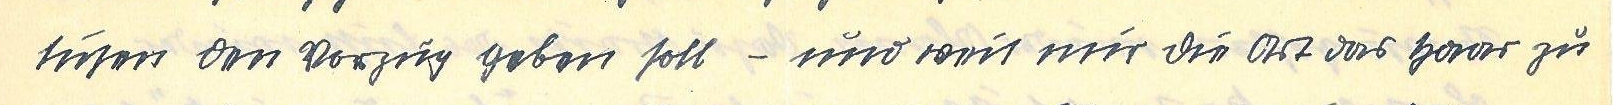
lichen den Vorzug geben soll – und weil mir die Art das Haar zu
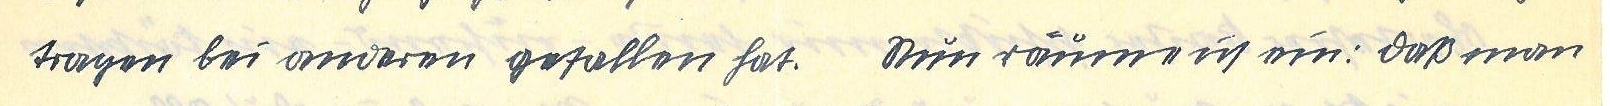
tragen bei anderen gefallen hat. Nun räume ich ein: daß man
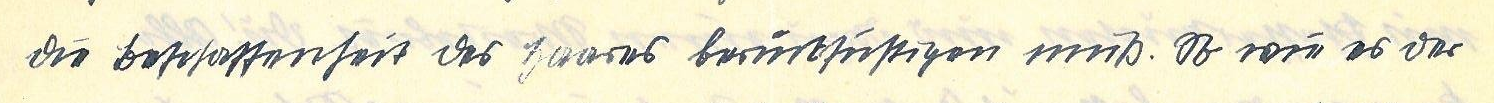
die Beschaffenheit des Haares berücksichtigen muß. So wie es der
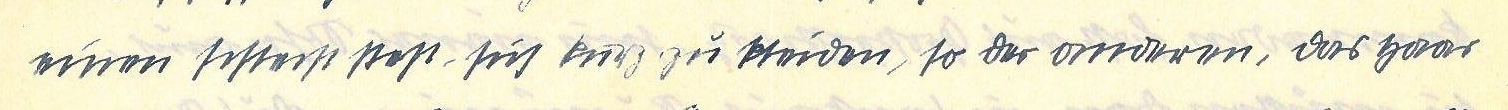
einen schlecht steht, sich kurz zu kleiden, so der anderen, das Haar
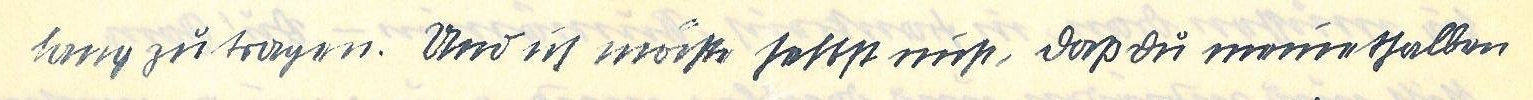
lang zu tragen. Und ich möchte selbst nicht, daß Du meinethalben
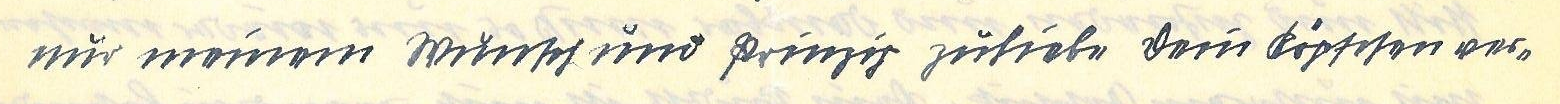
nur meinem Wunsch und Prinzip zuliebe Dein Köpfchen ver¬
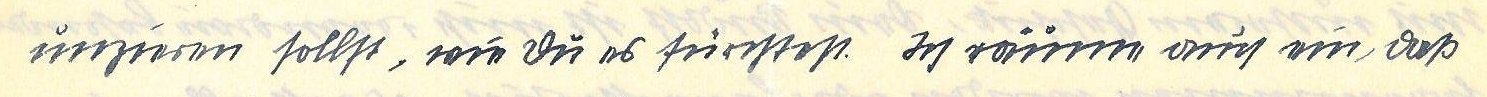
unzieren sollst, wie Du es fürchtest. Ich räume auch ein, daß
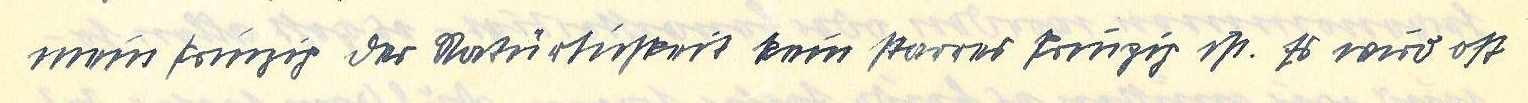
mein Prinzip der Natürlichkeit kein starres Prinzip ist. Es wird oft
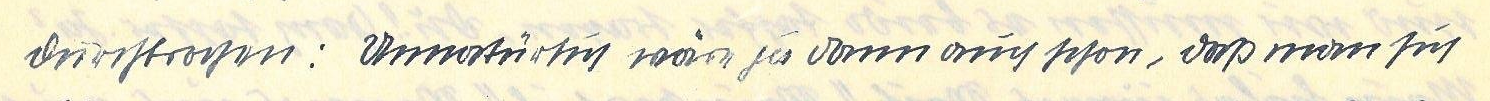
durchbrochen: Unnatürlich wäre ja dann auch schon, daß man sich
